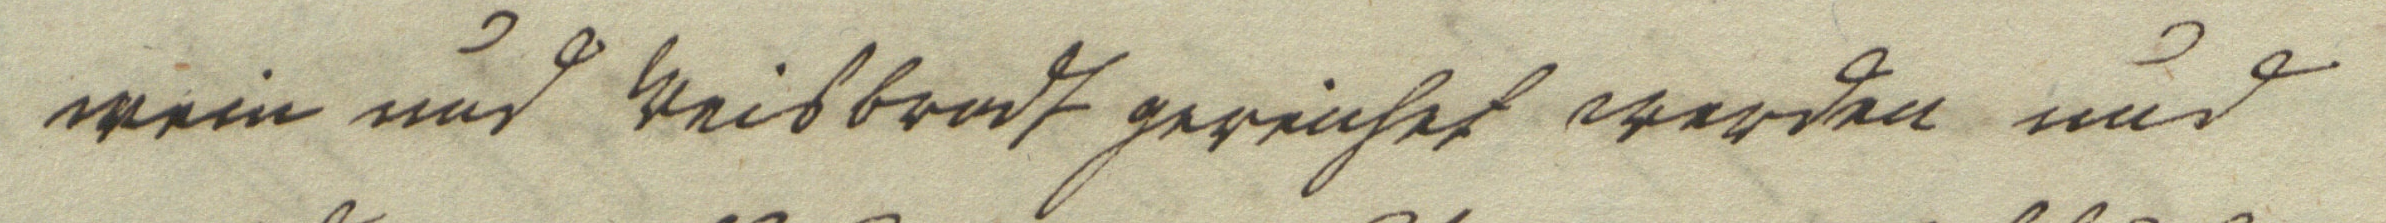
wein und Weisbrodt gereichet werden und
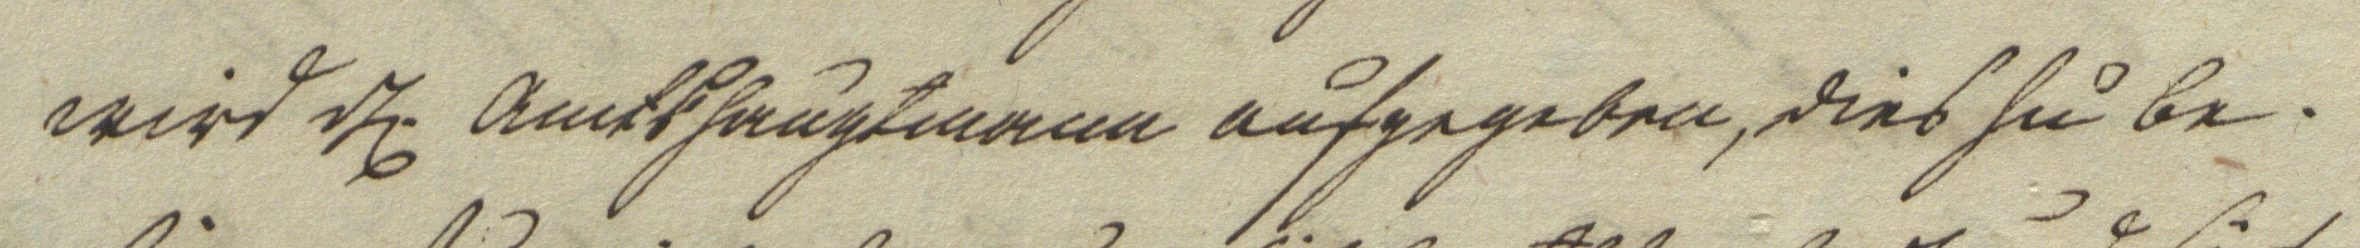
wird dh. Amtshauptmann aufgegeben, dies zu be¬
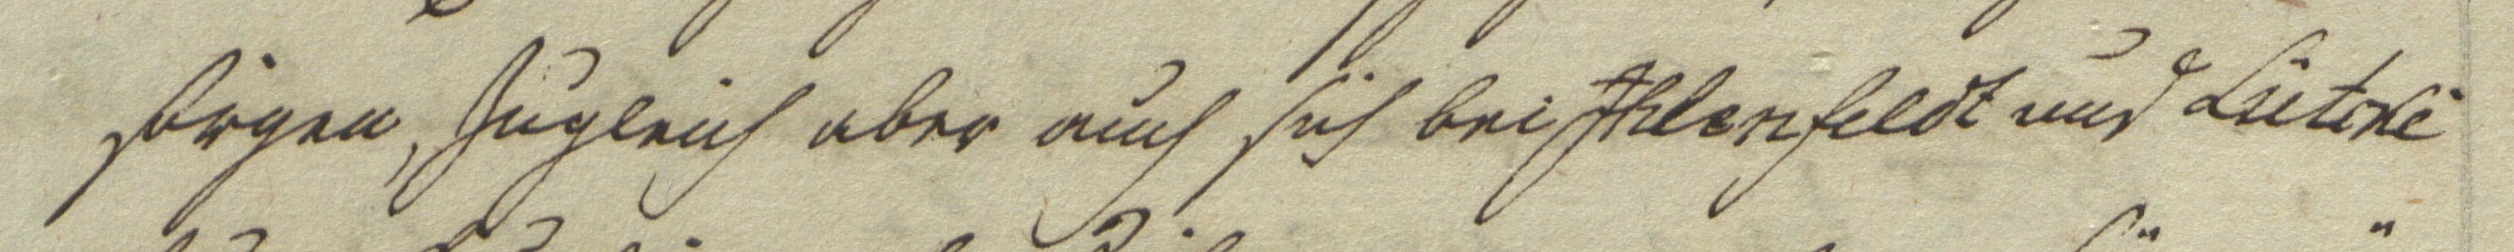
sorgen, zugleich aber auch sich bei Ihlenfeldt und Lütcke
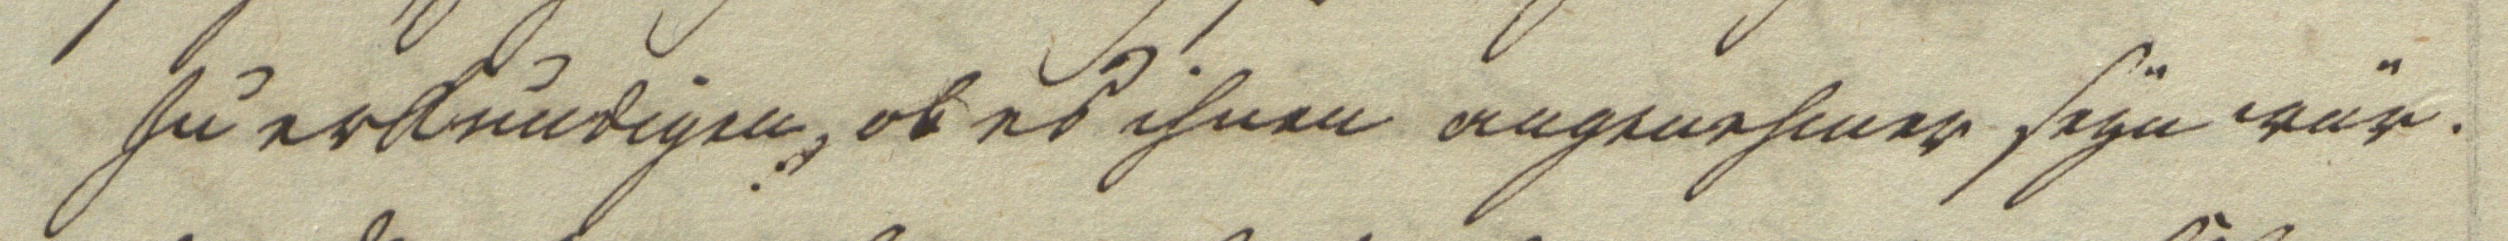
zu erkundigen, ob es ihnen angenehmer seyn wür¬
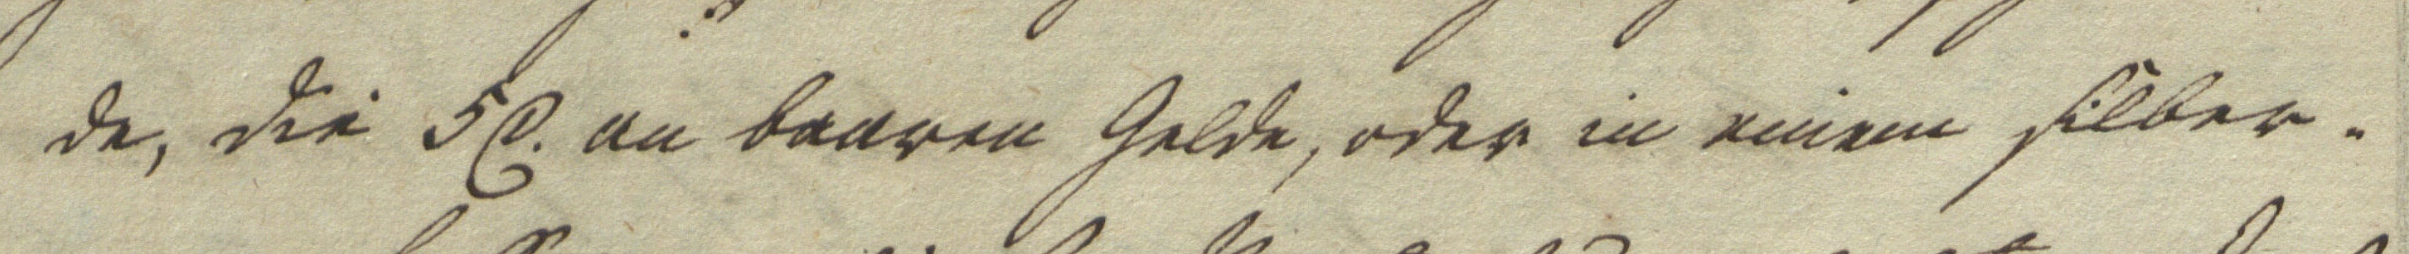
de, die 5 rtl. an baaren Gelde, oder in einem silber¬
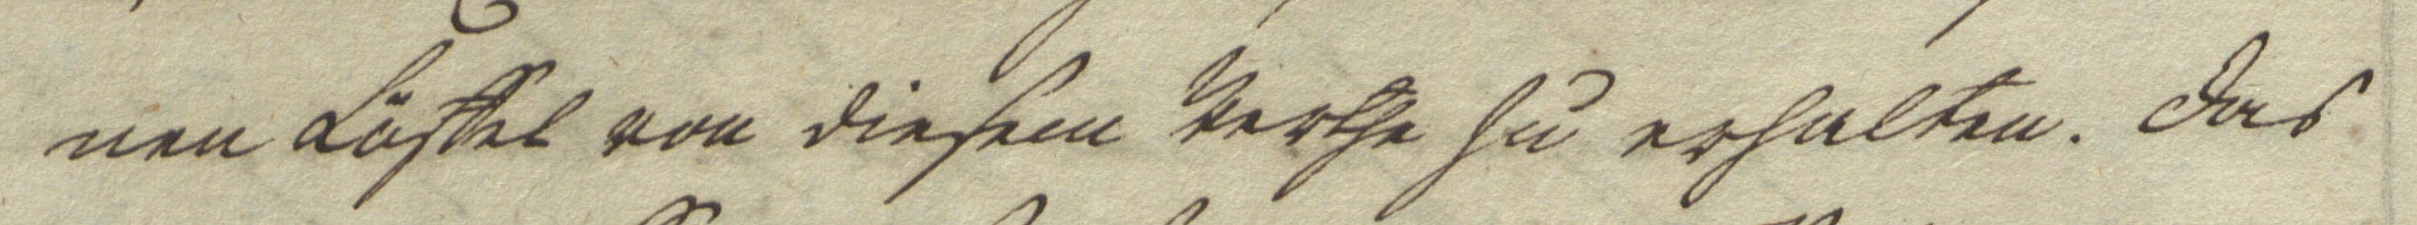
nen Löffel von diesem Werthe zu erhalten. Das
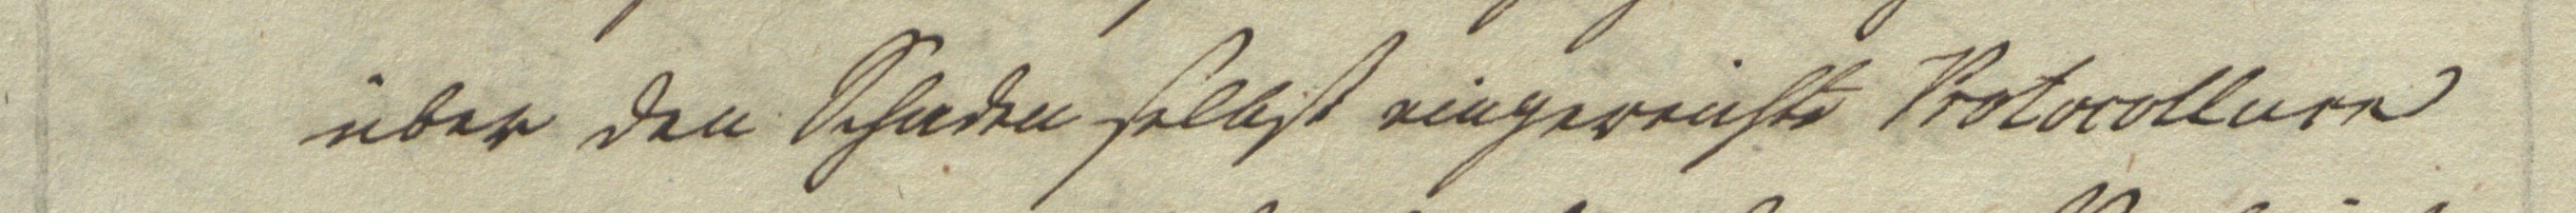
über den Schaden selbst eingereichte Protocollum
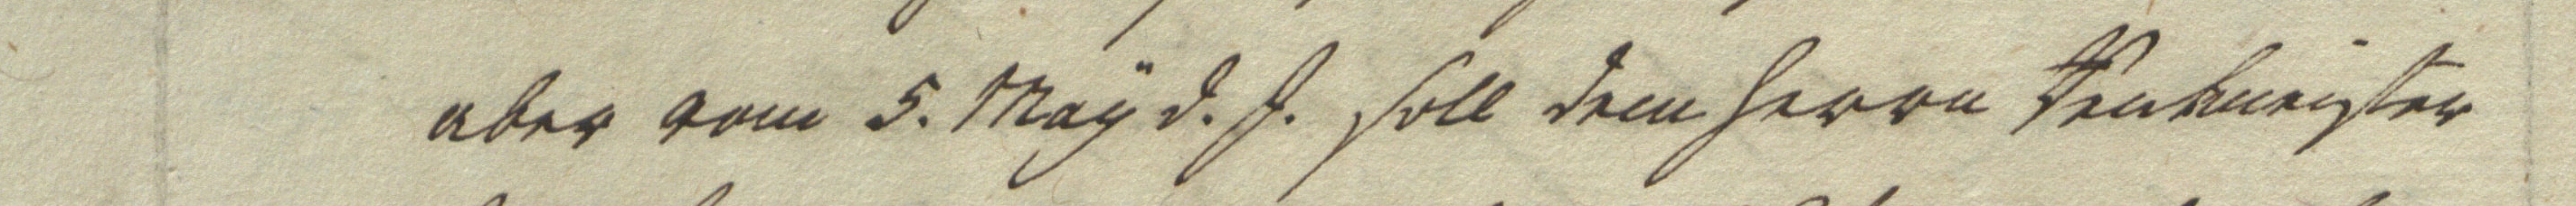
aber vom 5. May d. J. soll dem Herrn Rentmeister
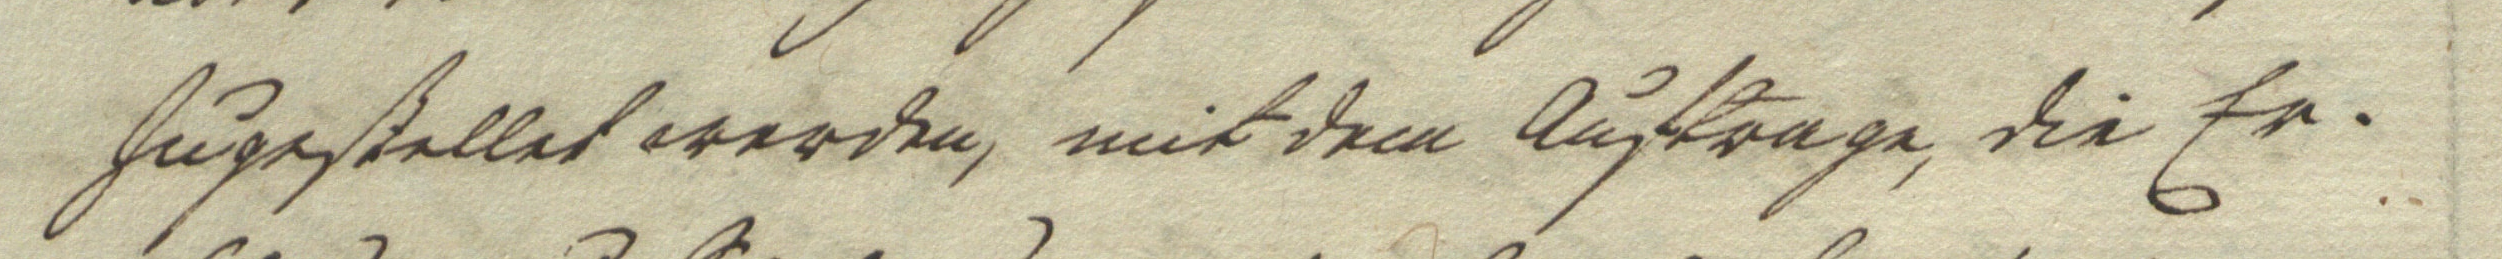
zugestellet werden, mit dem Auftrage, die Er¬
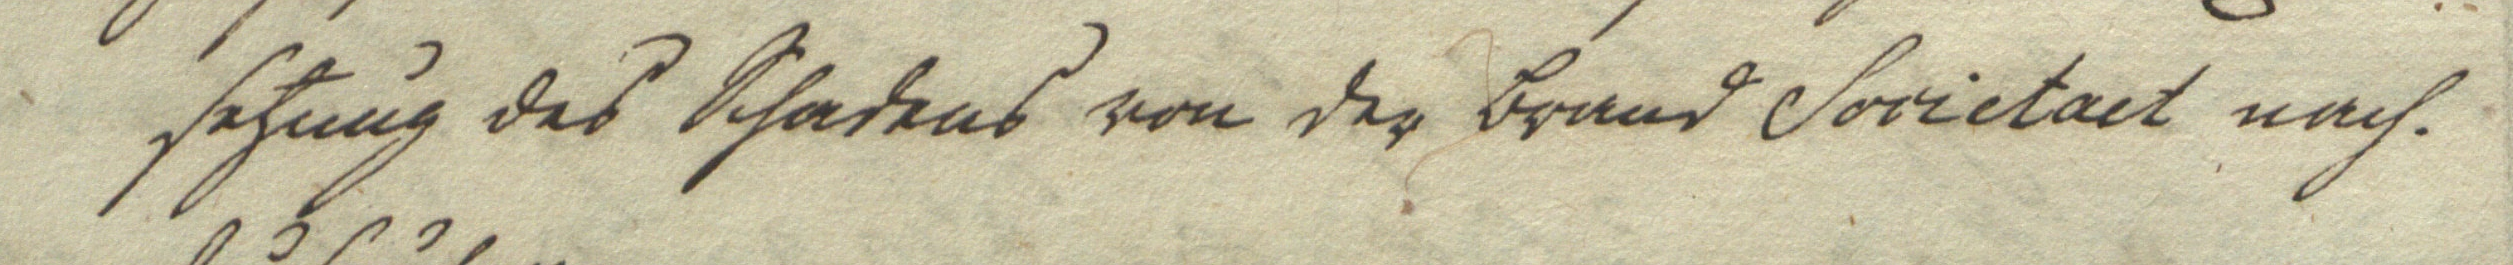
setzung des Schadens von der Brand Societaet nach¬
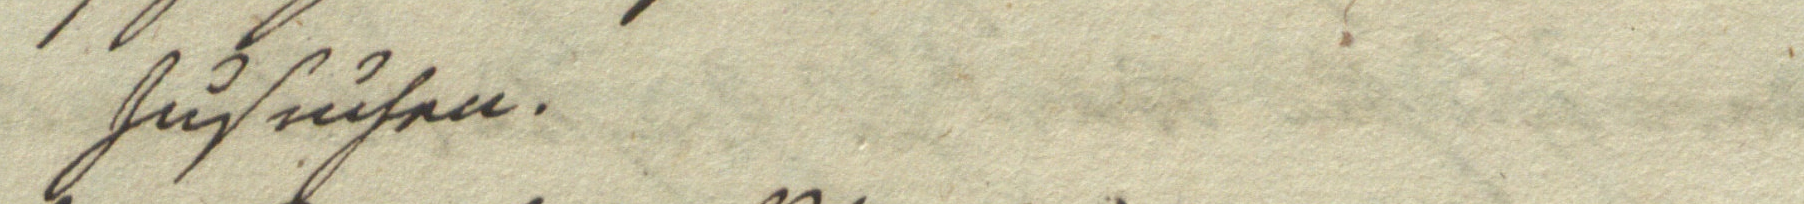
zusuchen.
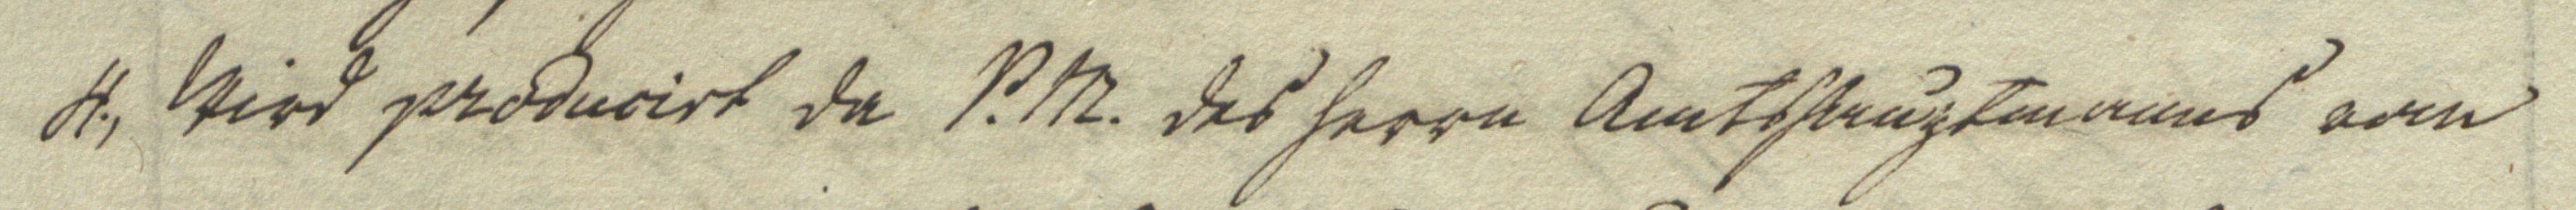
4., Wird producirt da P. M. des Herrn Amtshauptmanns vom
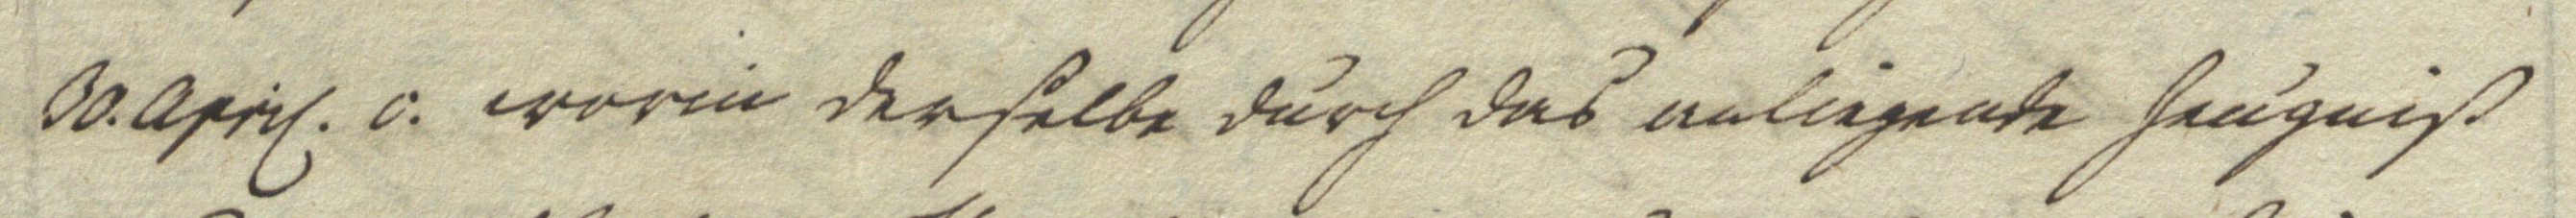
30. April. c. worin derselbe durch das anliegende Zeugniß
